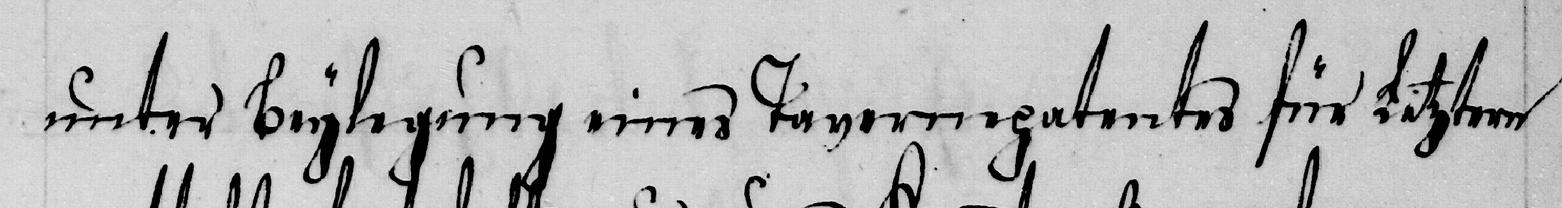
unter Beylegung eines Tavernepatentes für Letztern
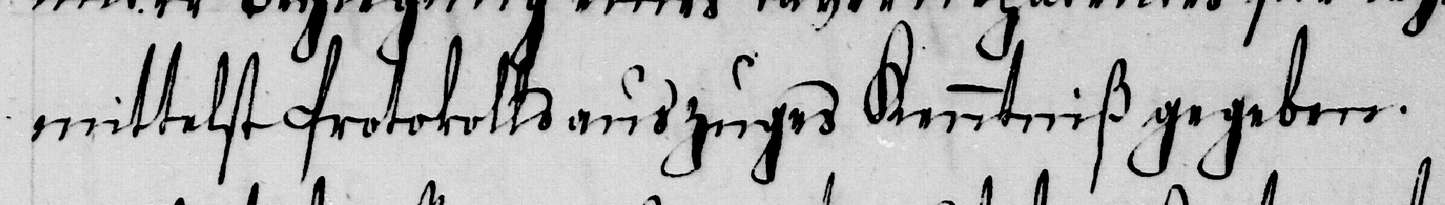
mittelst Protokollsauszuges Kenntniß gegeben.
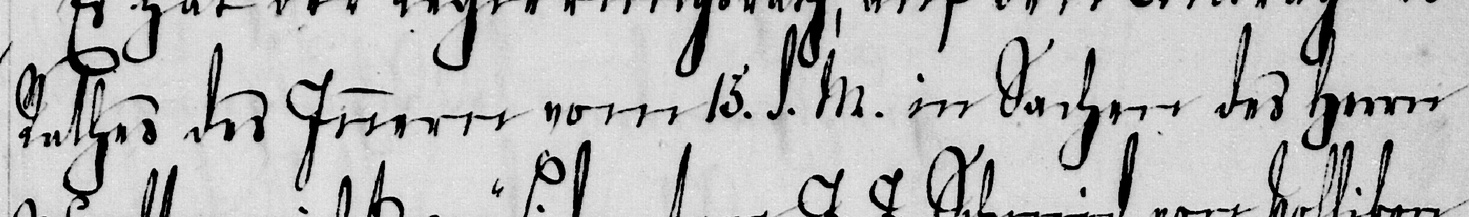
Rathes des Innern vom 15. d. M. in Sachen des Herrn
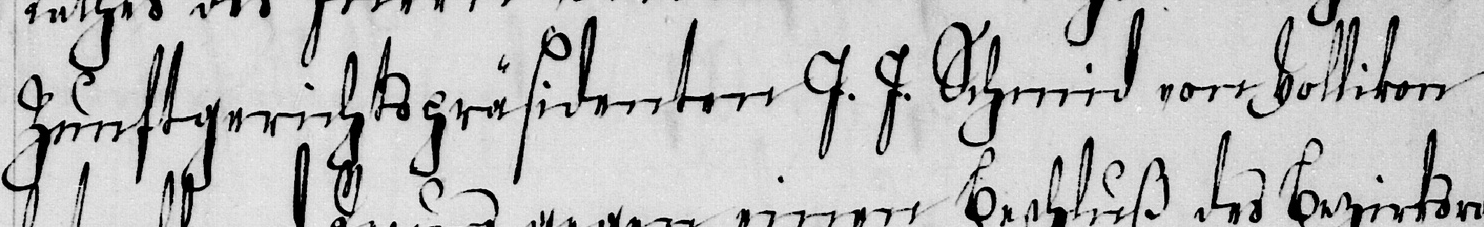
Zunftgerichtspräsidenten J. J. Schmid von Vollikon
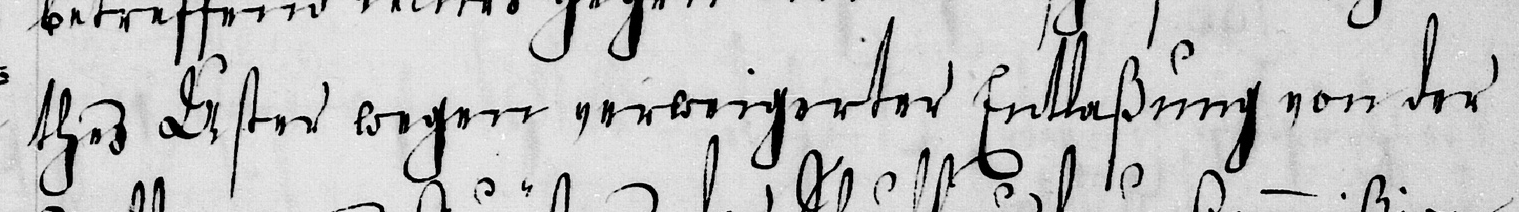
thes Uster wegen verweigerter Entlaßung von der
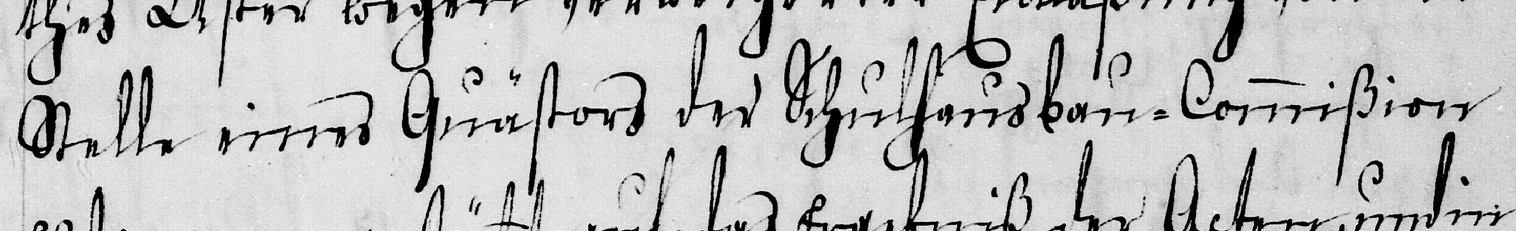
Stelle eines Quästors der Schulhausbau-Commißion
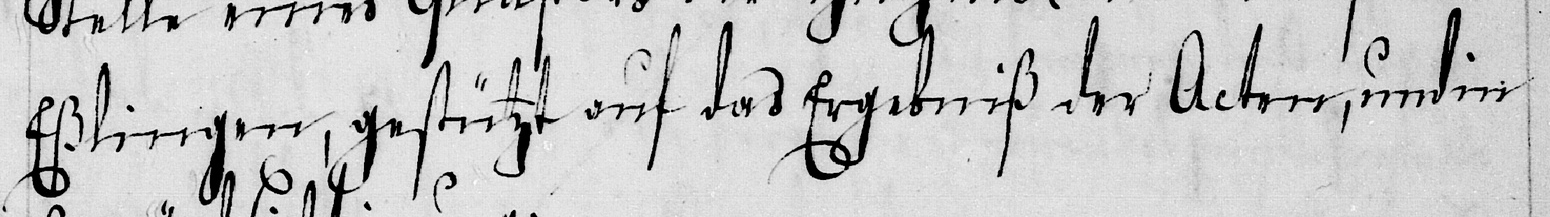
Eßlingen, gestützt auf das Ergebnis der Acten, und in
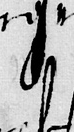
der
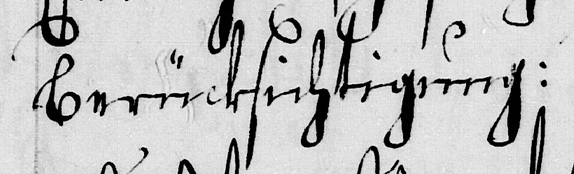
Berücksichtigung:
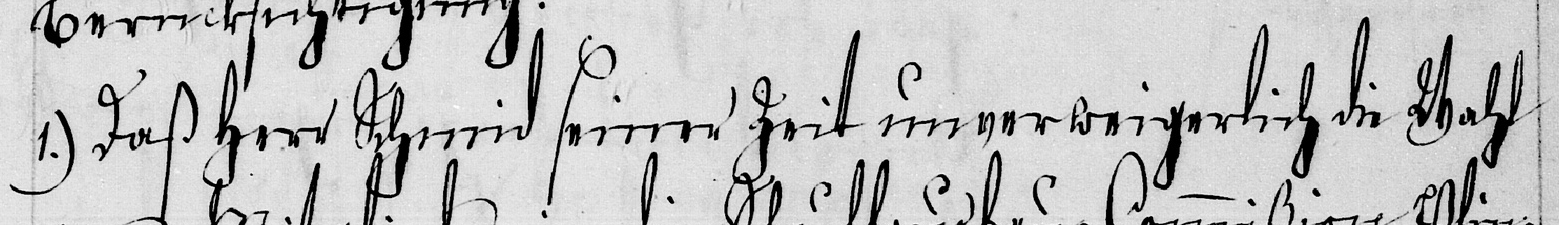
1.) Daß Herr Schmid seiner Zeit unverweigerlich die Wahl
